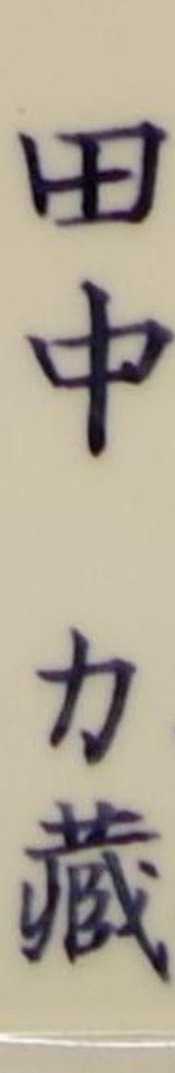田中力蔵
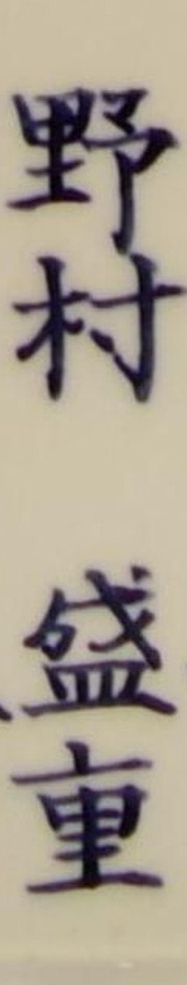野村盛重
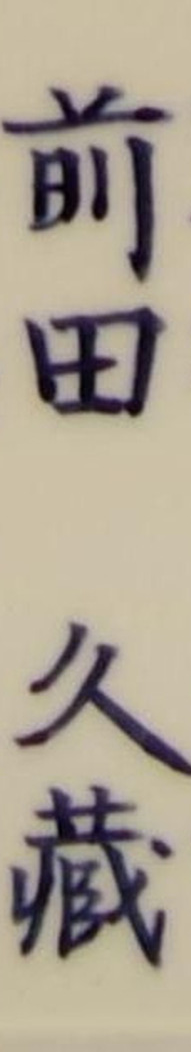前田久蔵
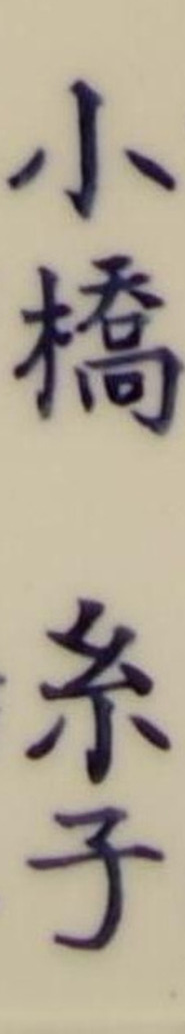小橋糸子
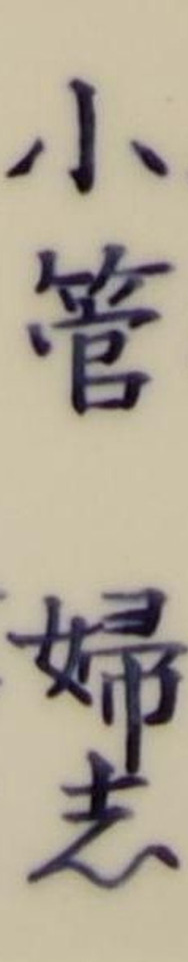小管婦志
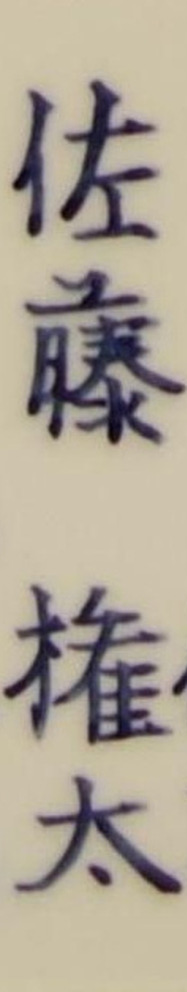佐藤権太
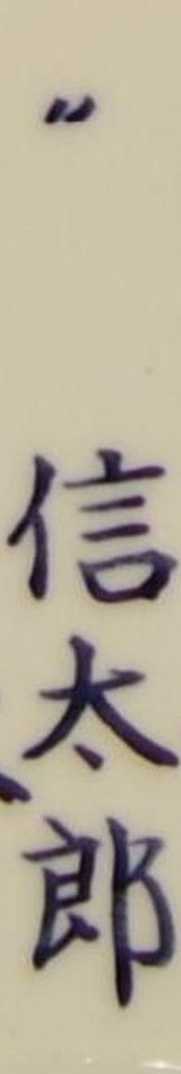信太郎
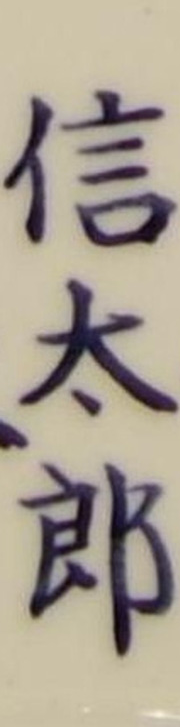信太郎
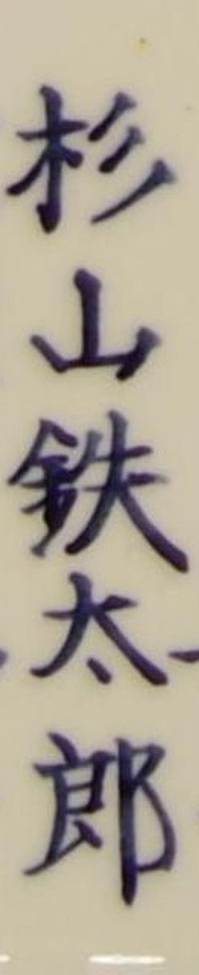杉山鉄太郎
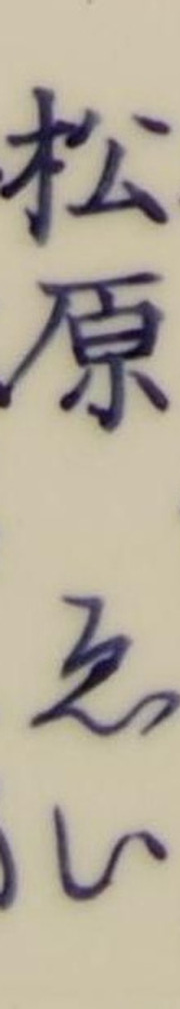松原ゑい
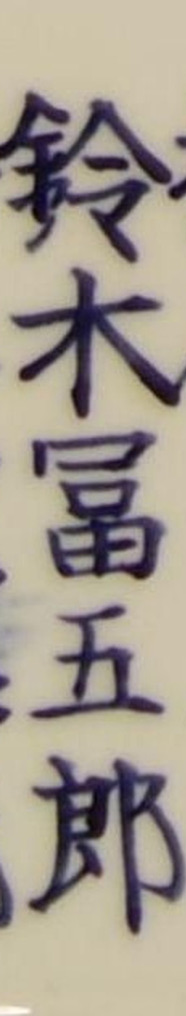鈴木冨五郎
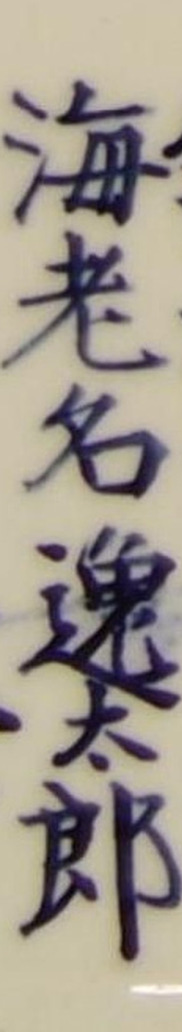海老名逸太郎
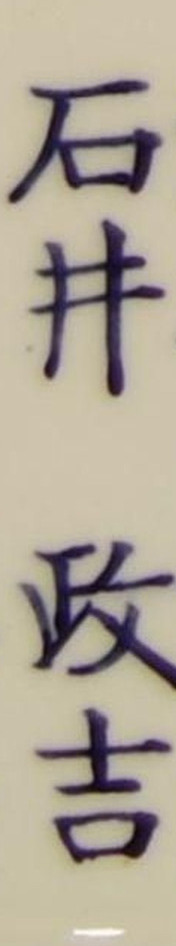石井政吉

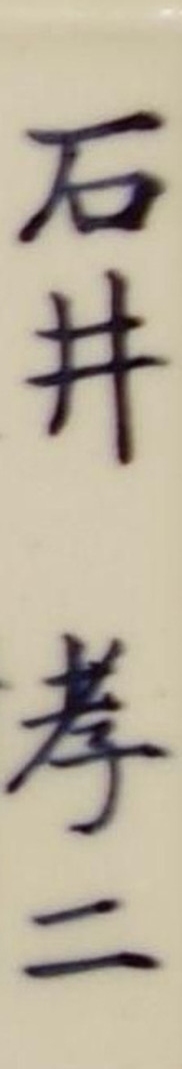石井孝二
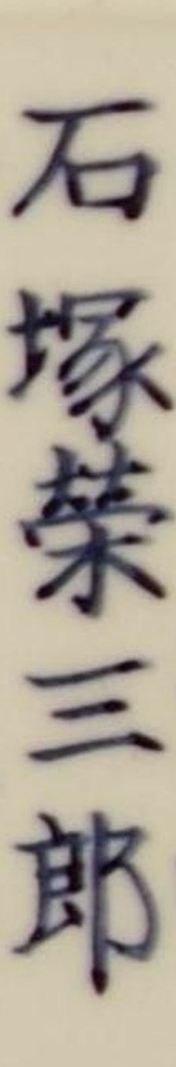石塚榮三郎
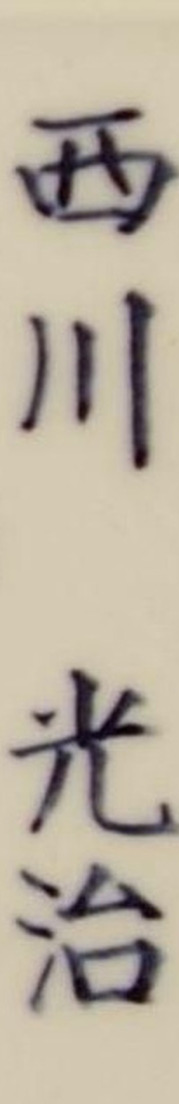西川光治
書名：A~D
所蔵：koyasan kongobuji
